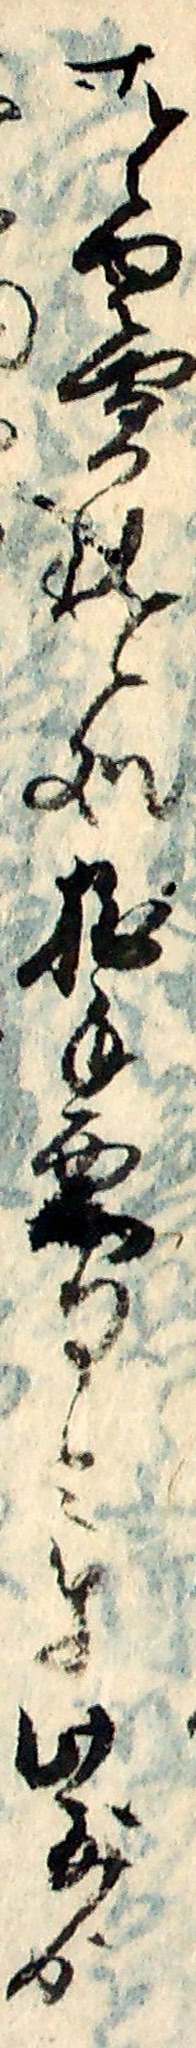右之商売仕候処勝手悪布候に付此度ゟ
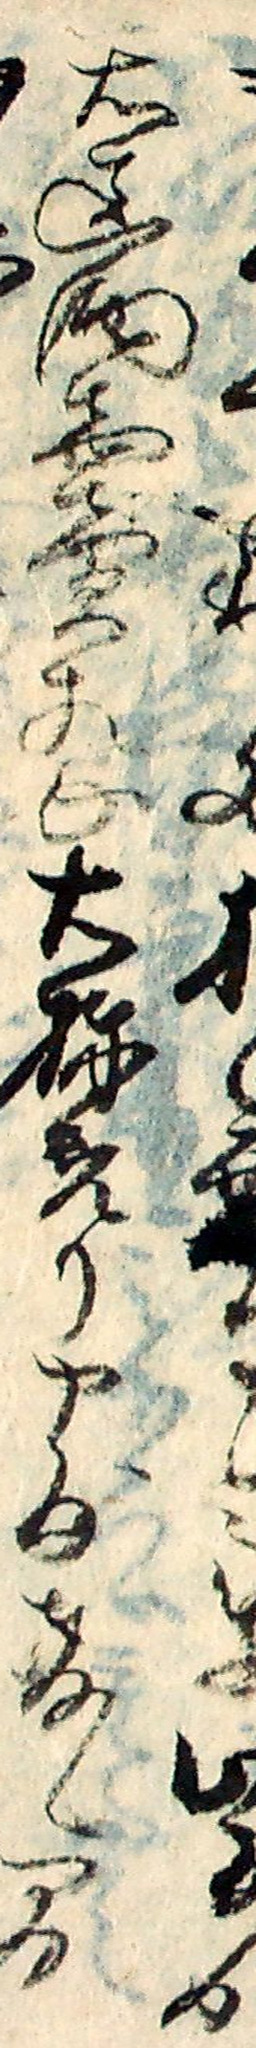右造酒商売相止右株売り申度奉存候間
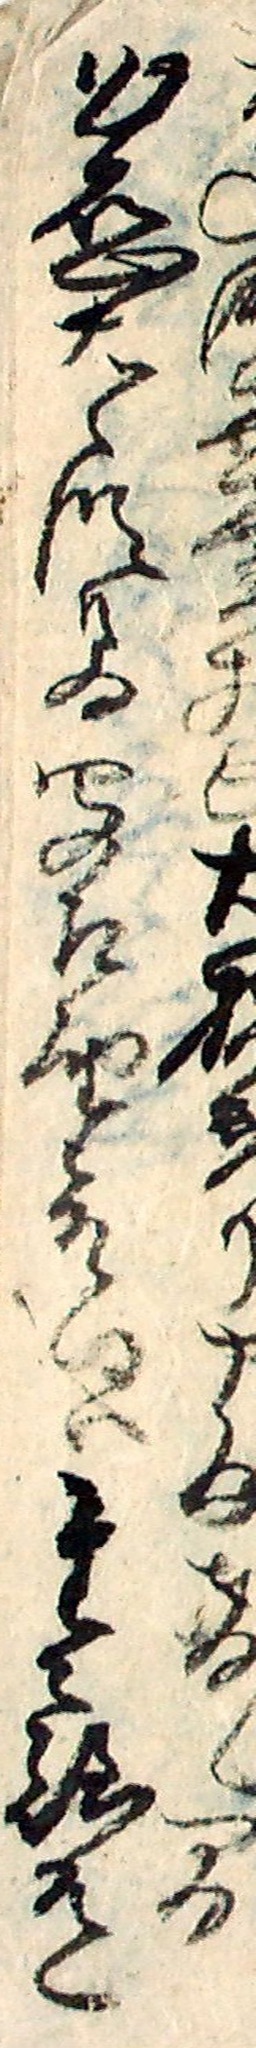乍恐右之段被為聞召届被下候得は重々難有

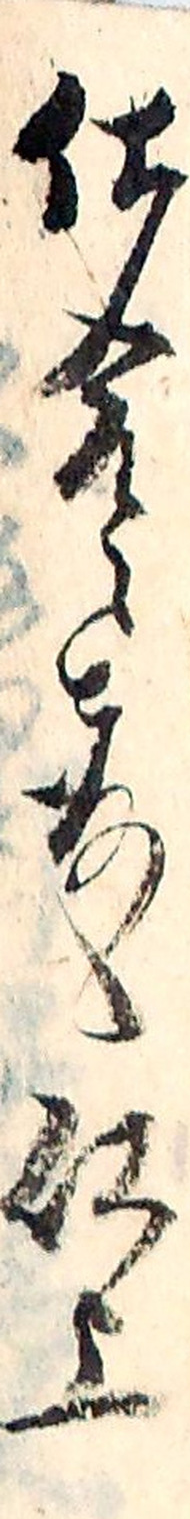仕合に奉存候以上
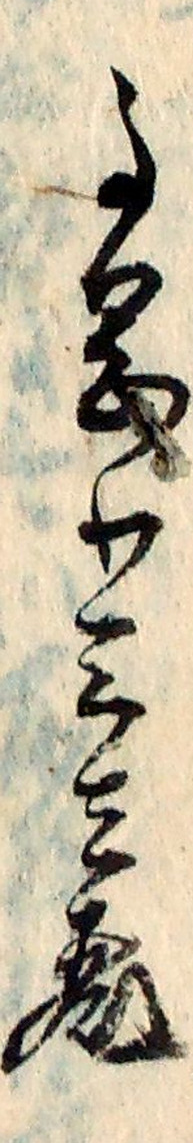高岡小三太殿
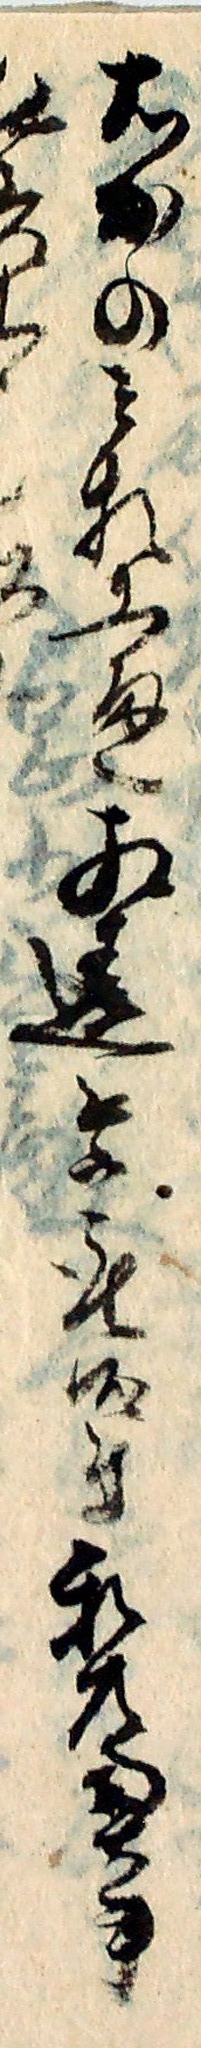右かの奉願上通相違無御座候に付私共奥書
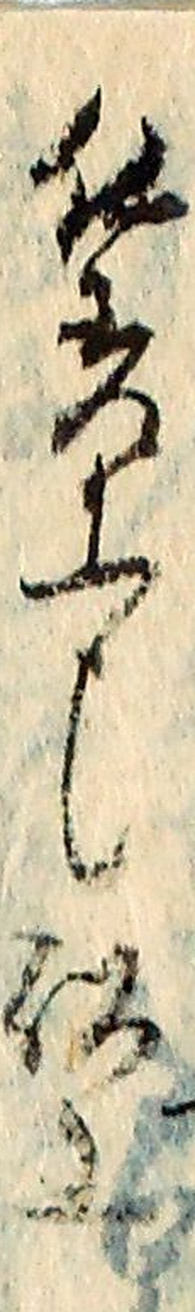仕差上申候以上
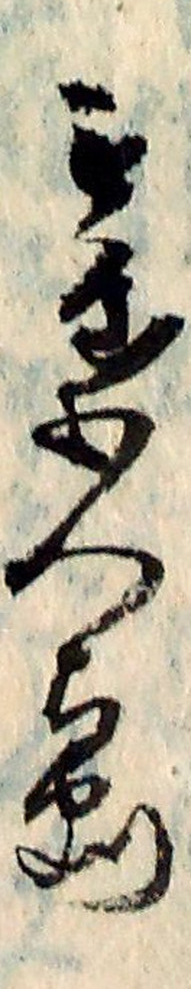庄屋五人与判
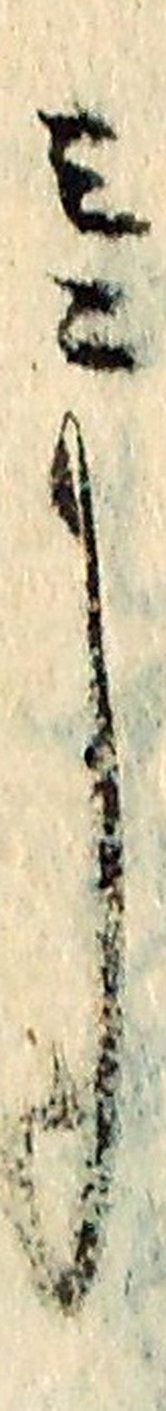巳二月
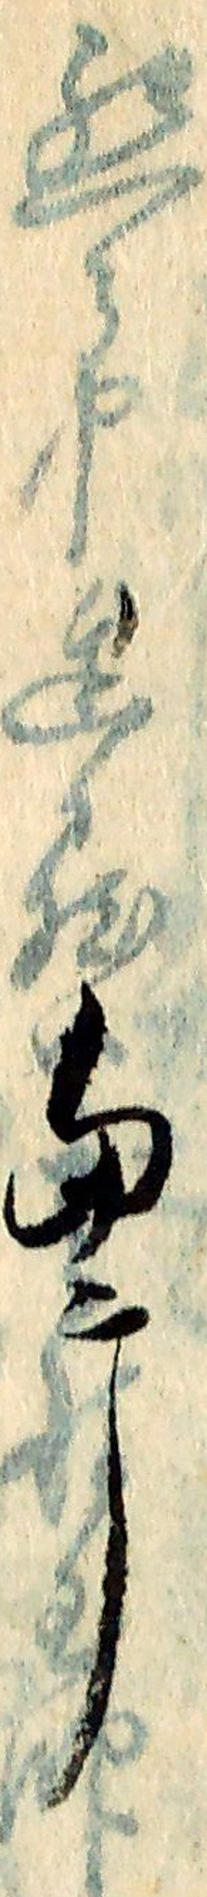巳二月
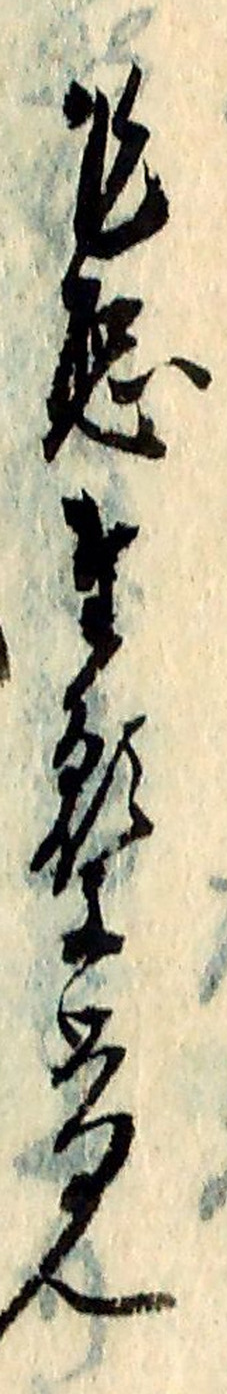乍恐奉願上覚
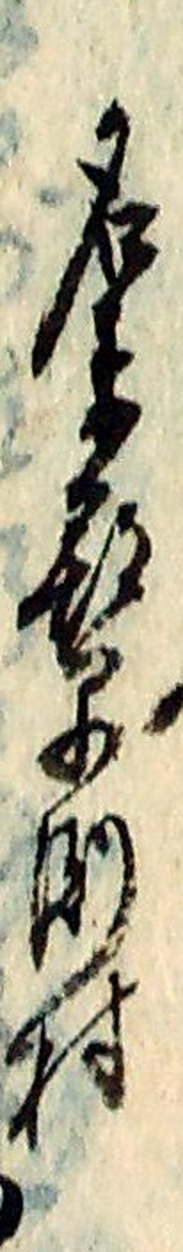名東郡早淵村
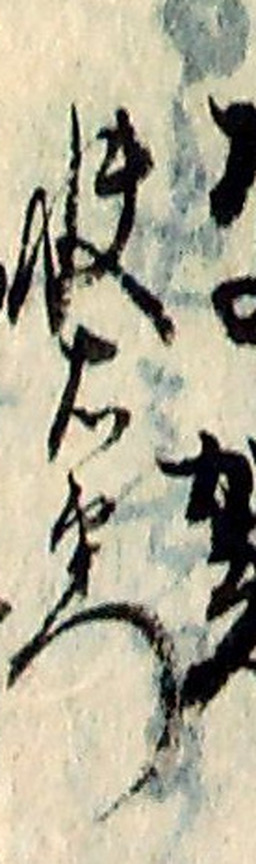快右衛門
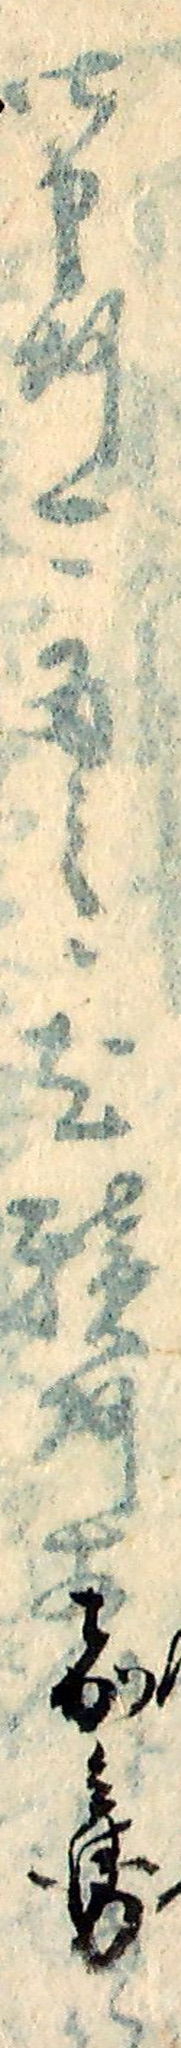嘉兵衛
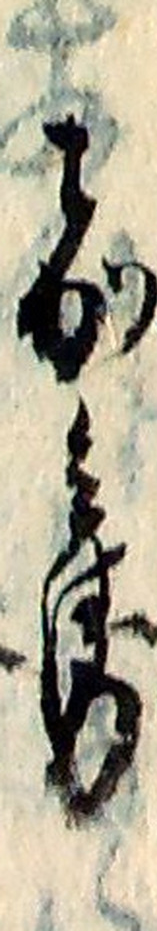嘉兵衛
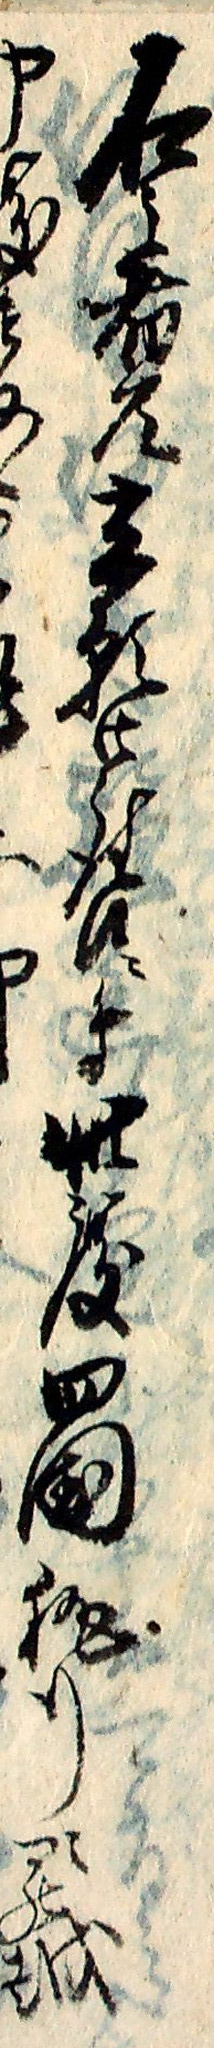右之者共立願御座候に付此度四国執行に罷越
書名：諸御願書控(後藤氏壱番）
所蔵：鳴門教育大学 Naruto University of Education
